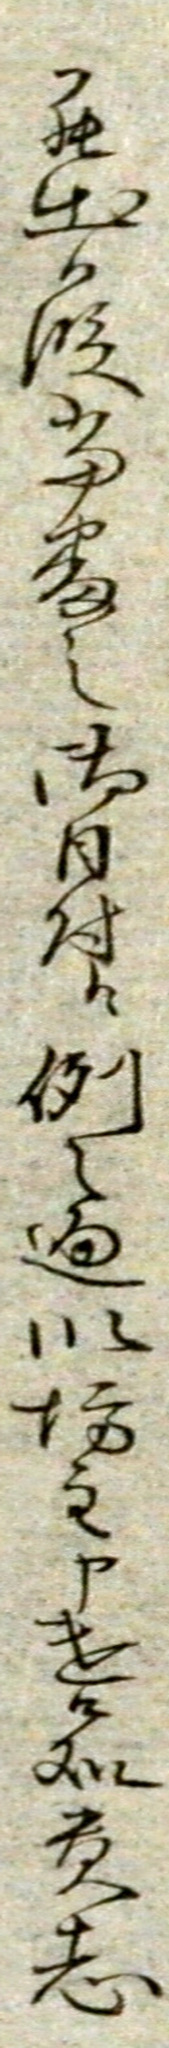一罷出候段当番之御目付江例之通以坊主申遣候処貢志
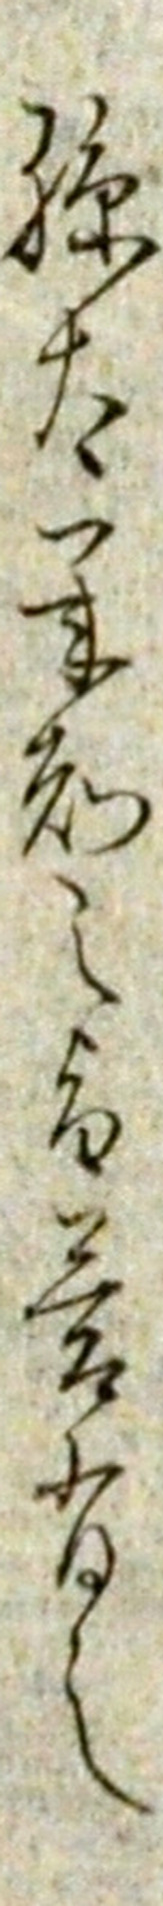孫太承知之旨答有之
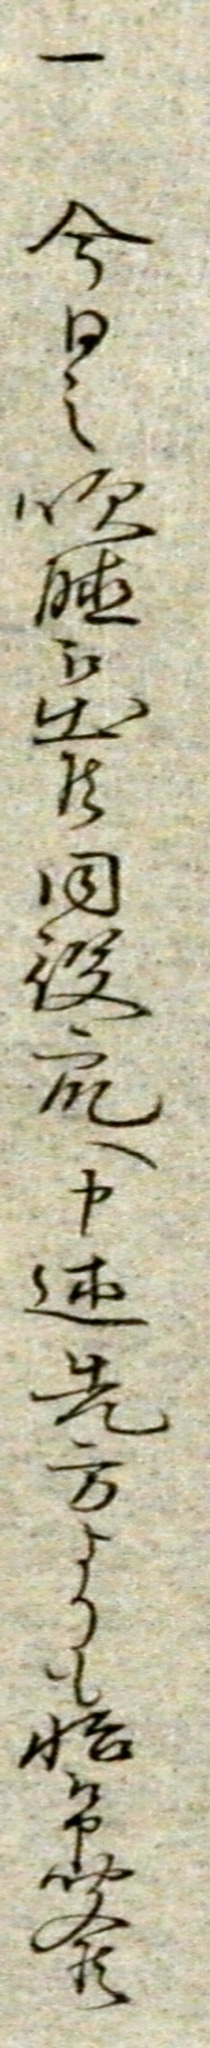一今日之吹聴罷出候同役衆へ申述先方よりも始被申聞候
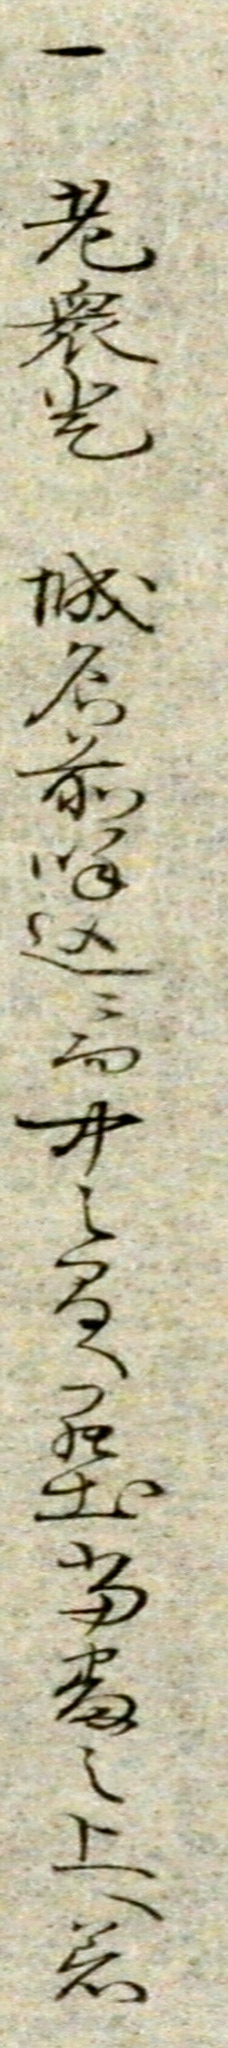一老衆登城名前呼込ニ而中之間へ罷出当番之上へ着
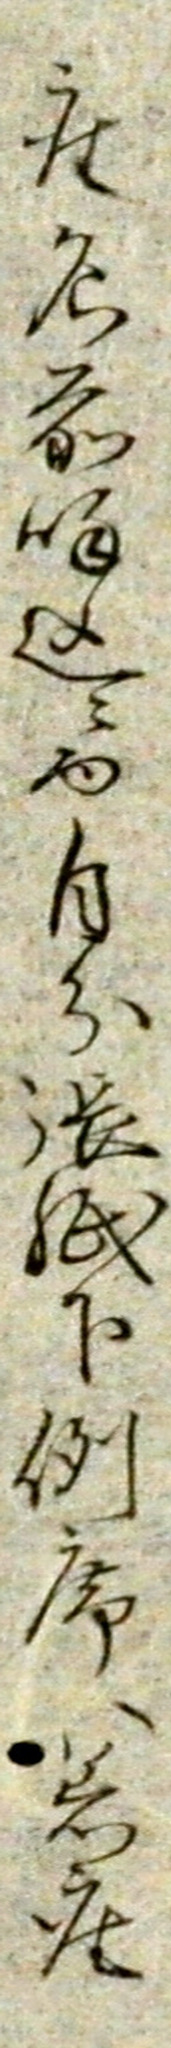座名前呼込ニ而自分張紙下例席へ着座
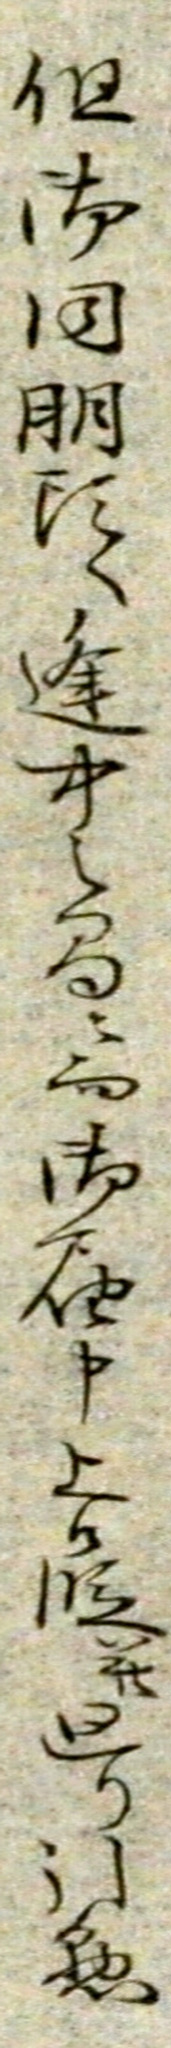但御同朋頭へ逢中之間ニ而御届申上候段并廻り引懸
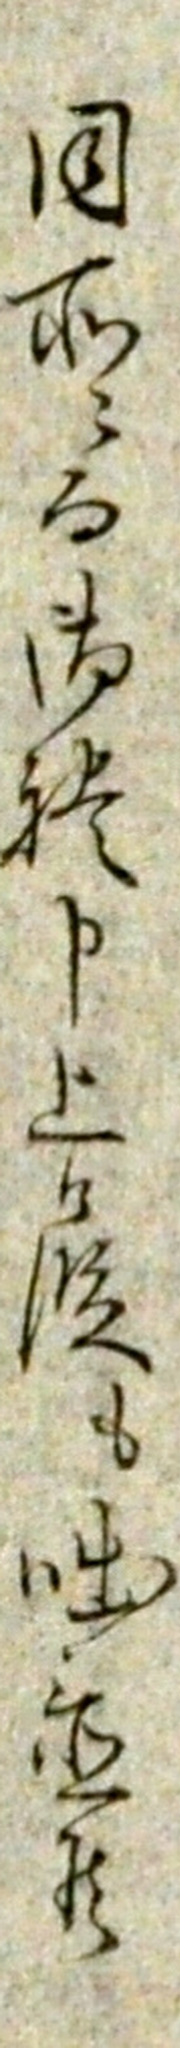同所ニ而御礼申上候段も咄置候
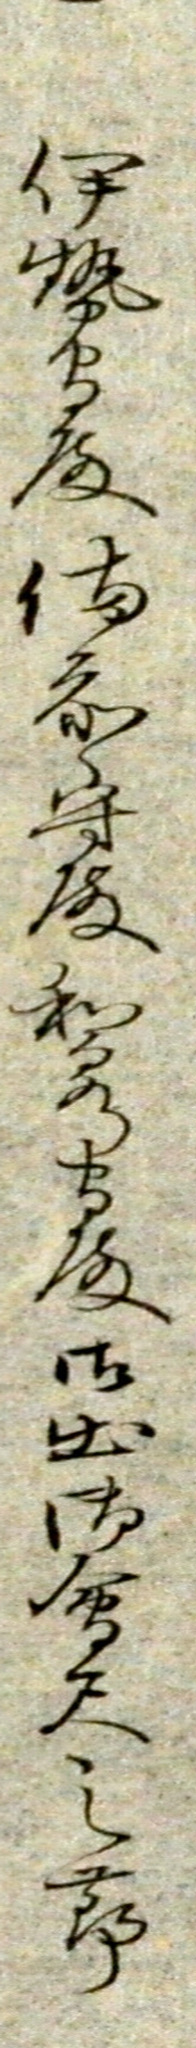一伊勢守殿備前守殿和泉守殿御出御会天之節
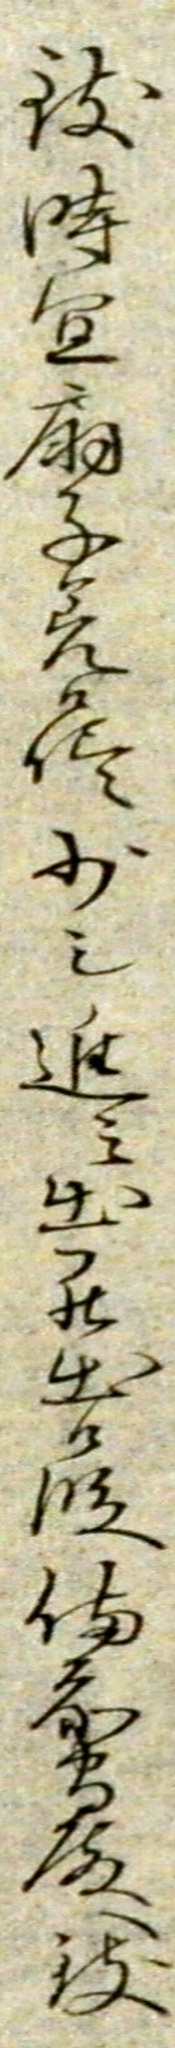致時宜扇子差候儘少シ進ミ出罷出候段備前守殿へ致
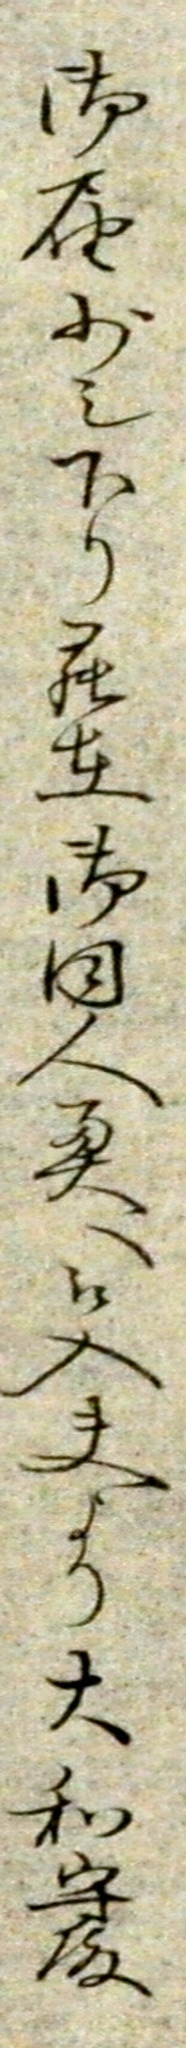御届少シ下り罷在御同人奥へ被入夫より大和守殿
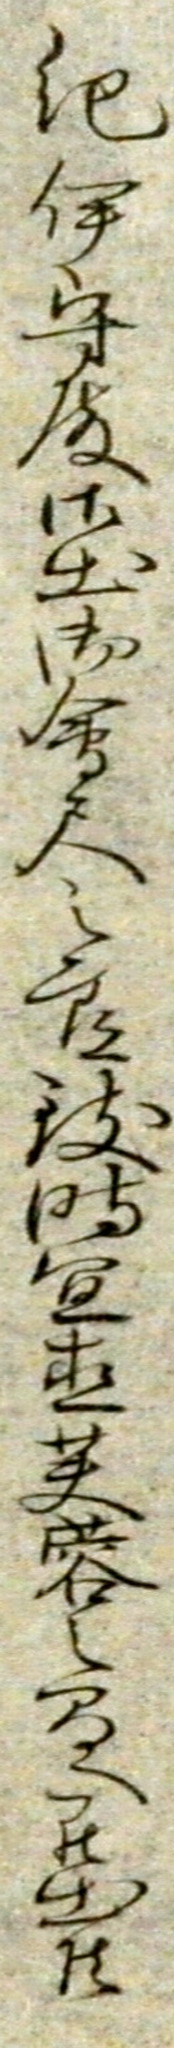紀伊守殿御出御会尺之座致時宜直芙蓉之間へ罷出候
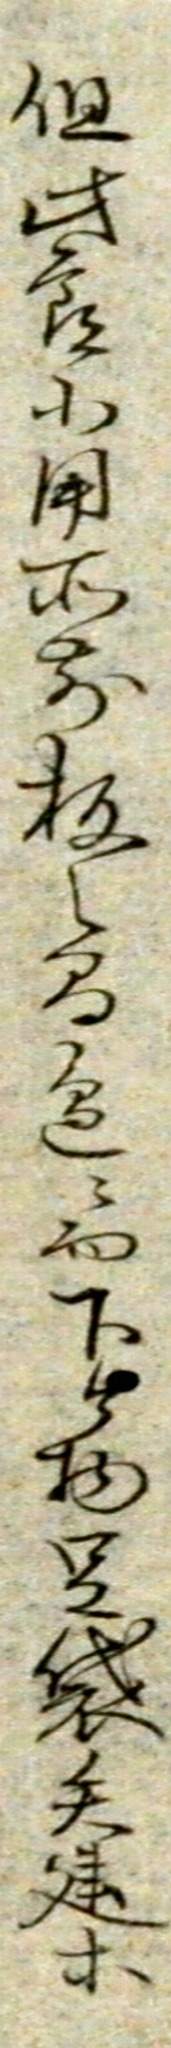但此節小用所前板之間辺ニ而下ケ物足袋矢建等
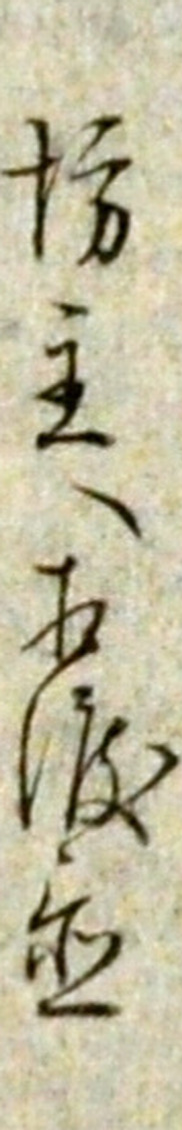坊主へ相渡置
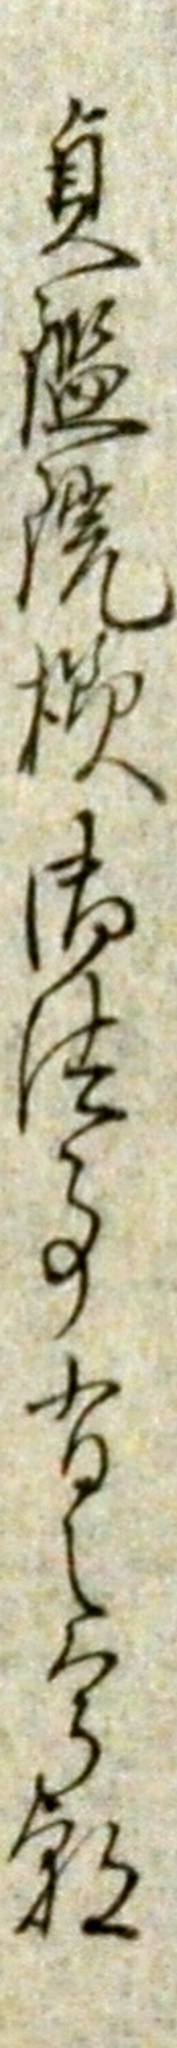貞鑑院様御法事有之今朝
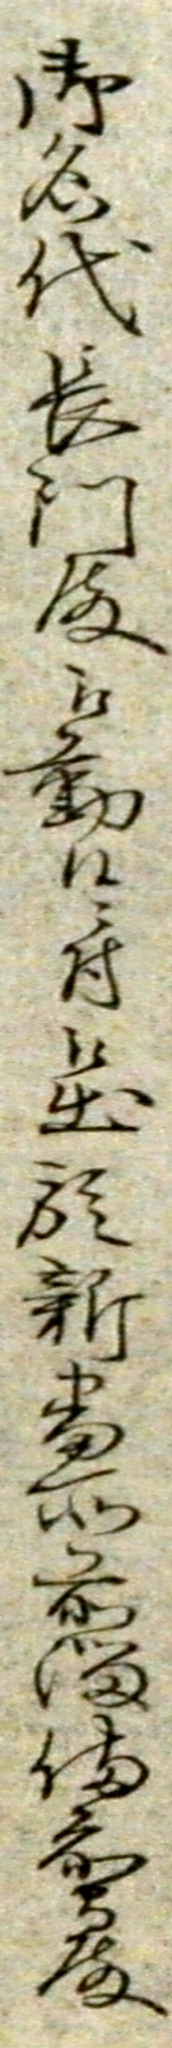御名代長門殿被勤候ニ付被出於新番前溜備前守殿
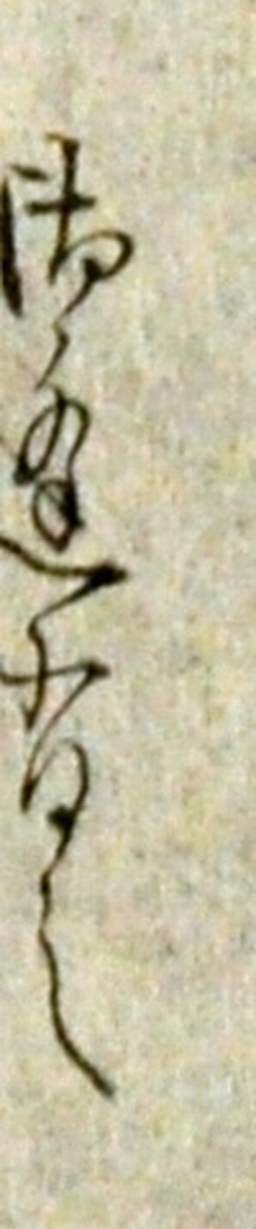御逢有之
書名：日光御名代相勤候節ノ留
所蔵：伊那市立高遠町図書館・合同会社AMANE
